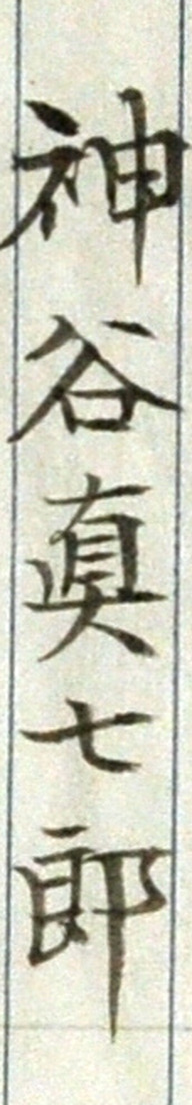神谷真七郎
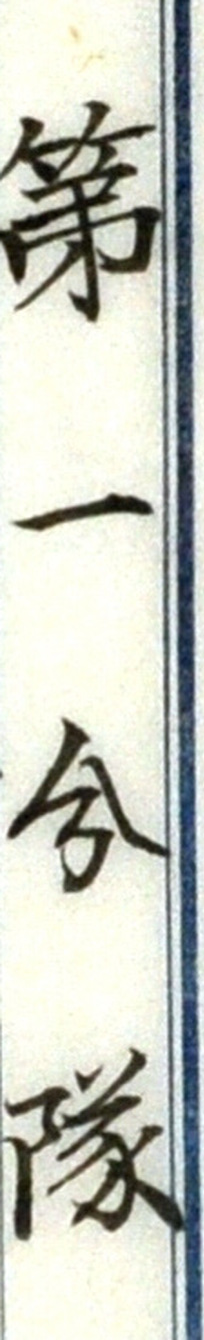第一分隊

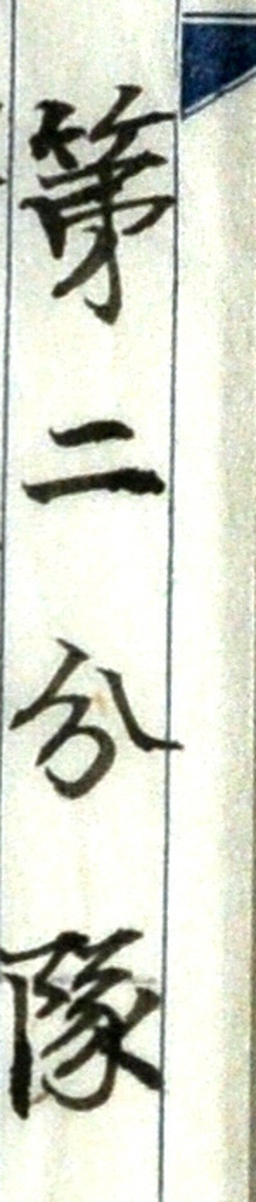第二分隊
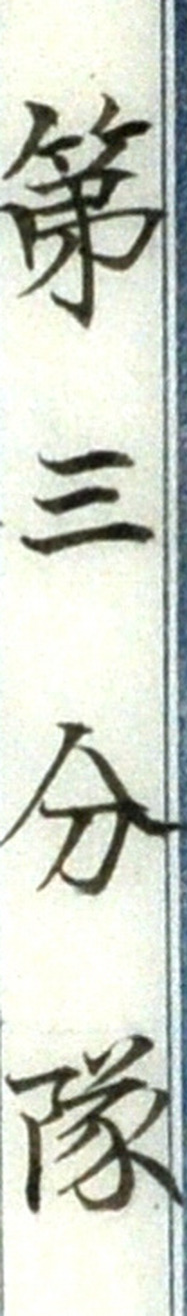第三分隊
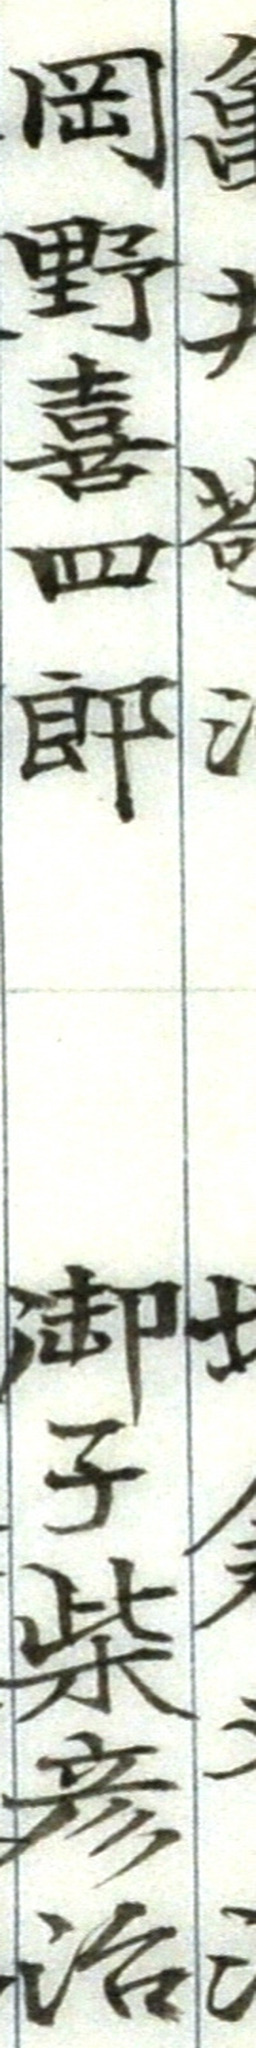岡野喜四郎御子柴彦治
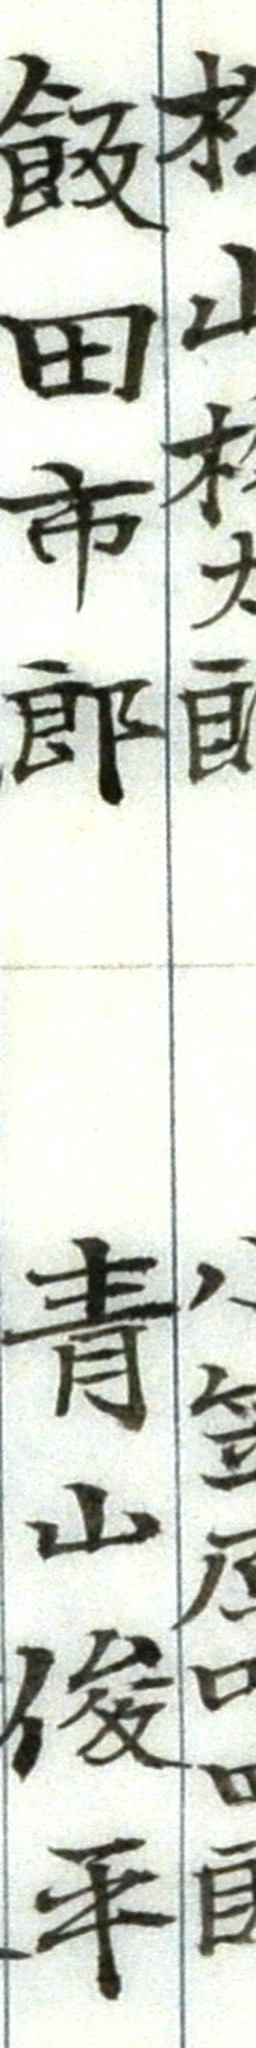飯田市郎青山俊平
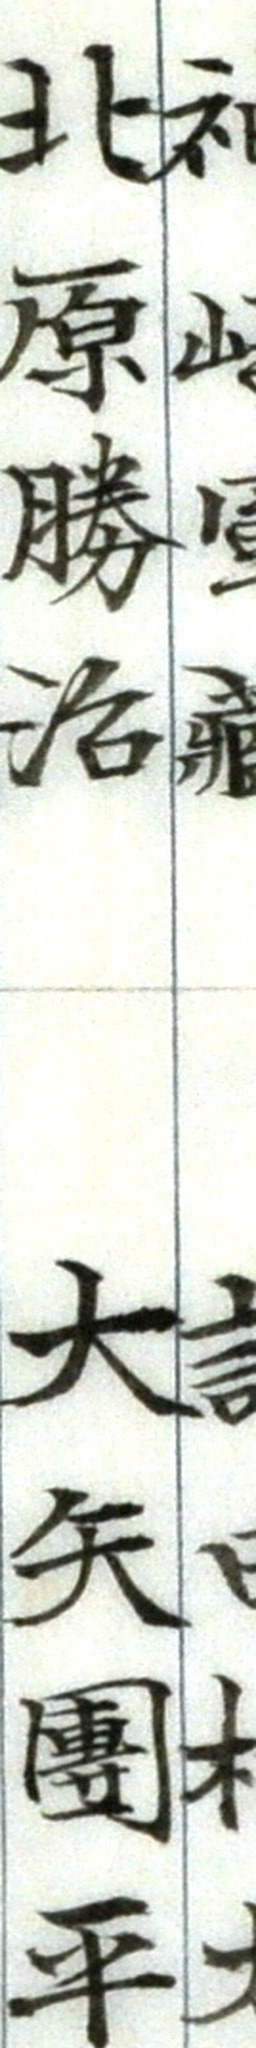北原勝治大矢団平
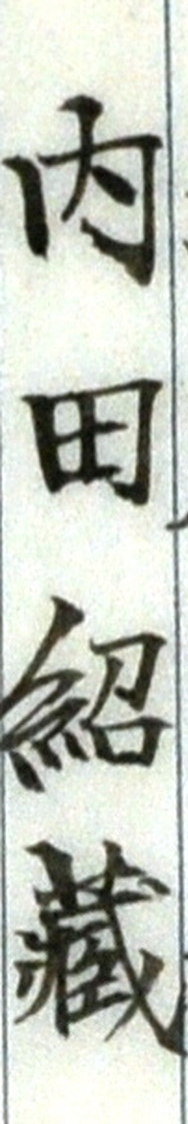内田紹蔵

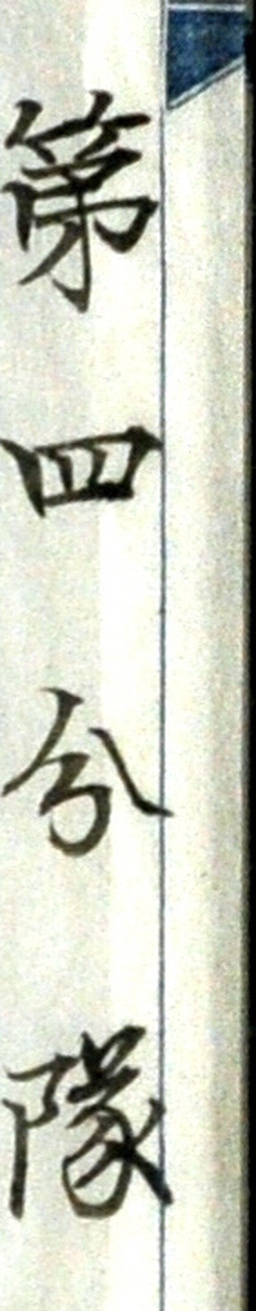第四分隊
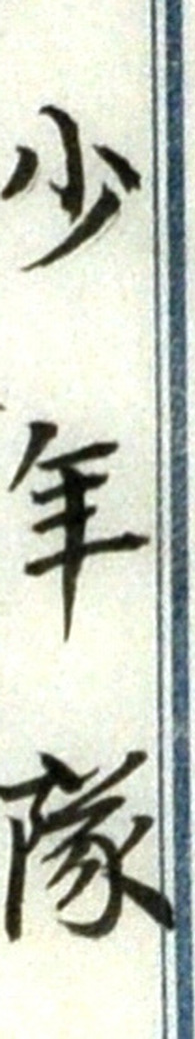少年隊
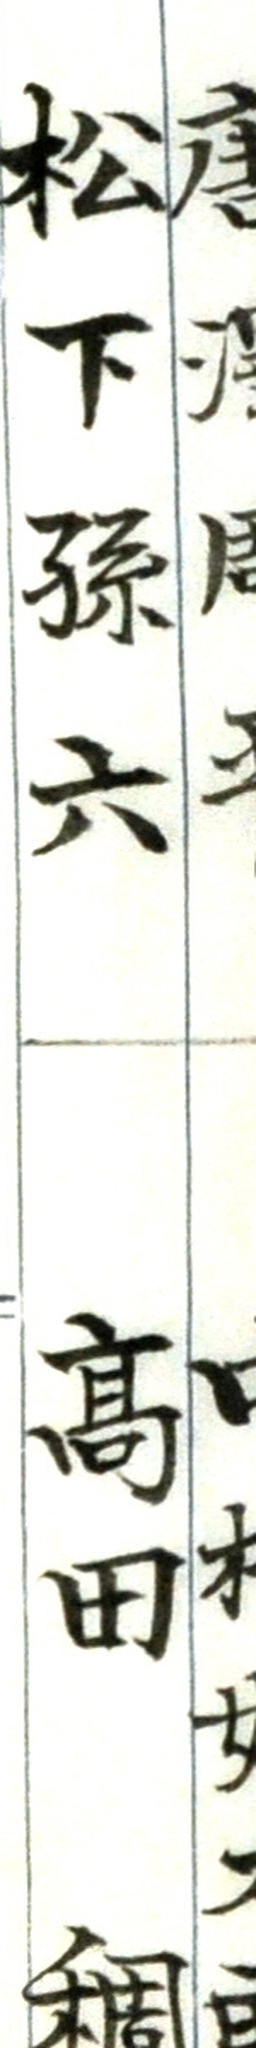松下孫六高田稠

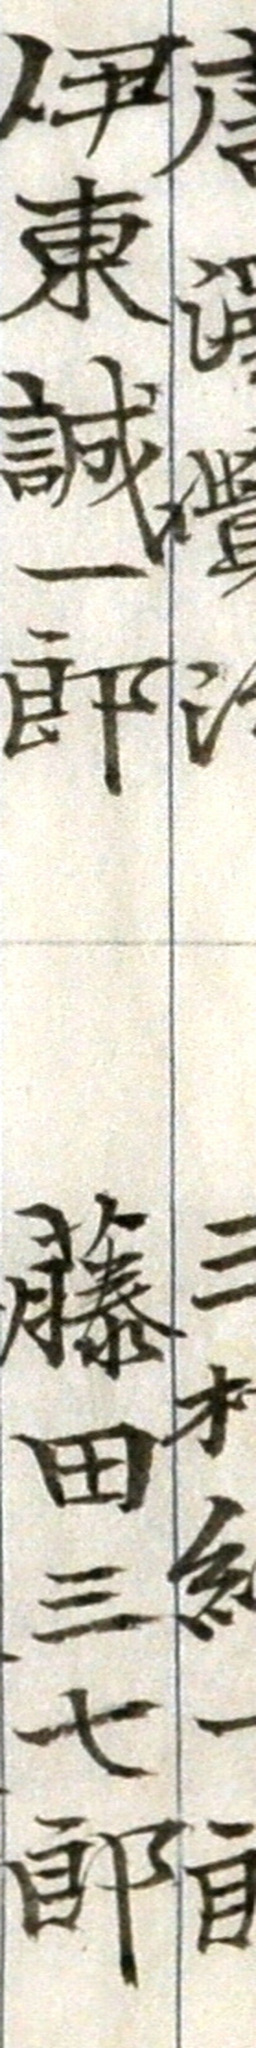伊東誠一郎藤田三七郎
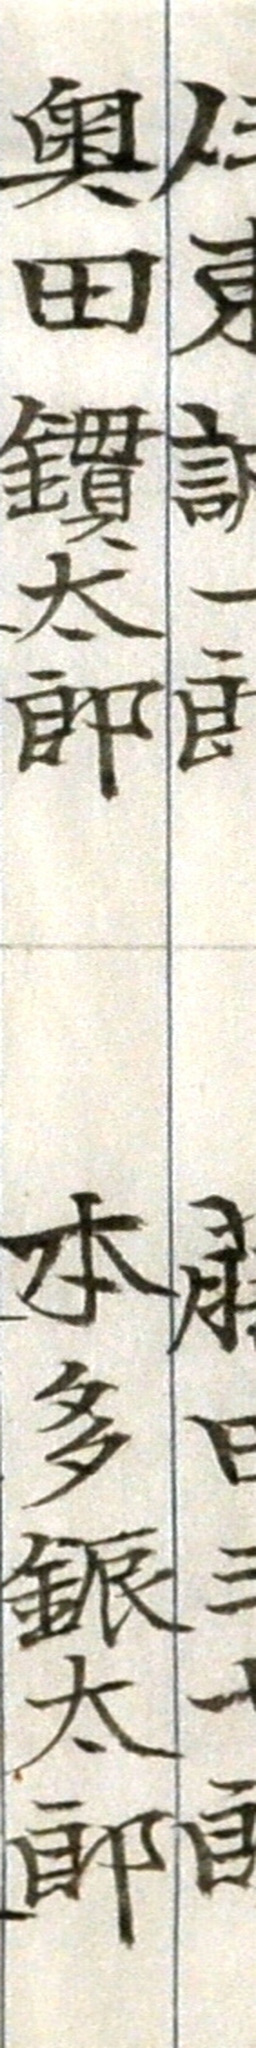奥田鏆太郎本多鋠太郎
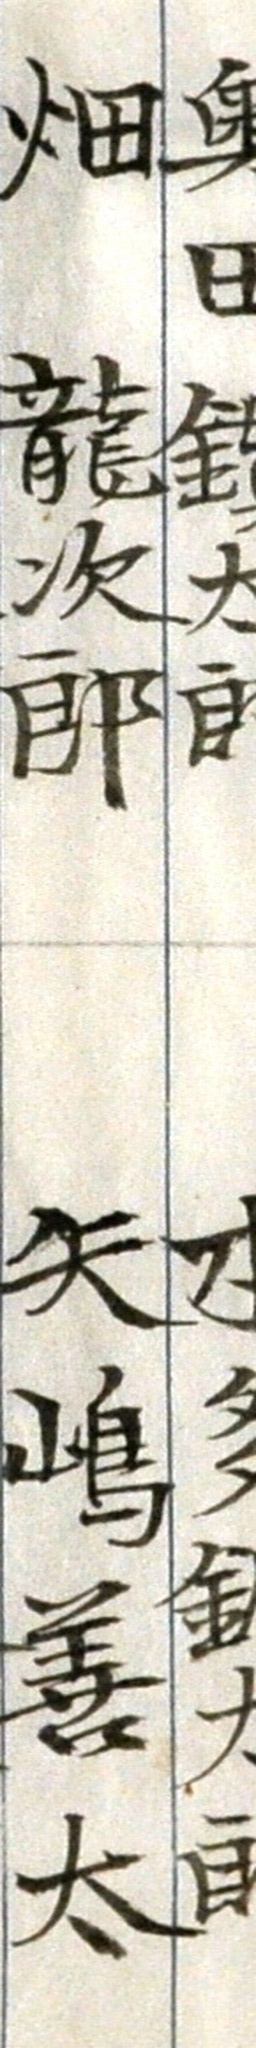畑龍次郎矢嶋善太
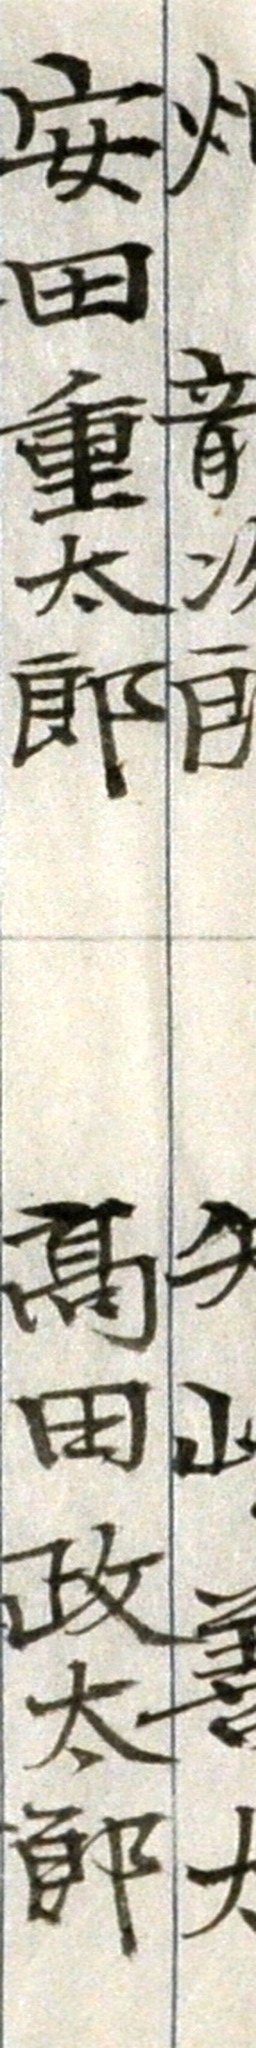安田重太郎高田政太郎
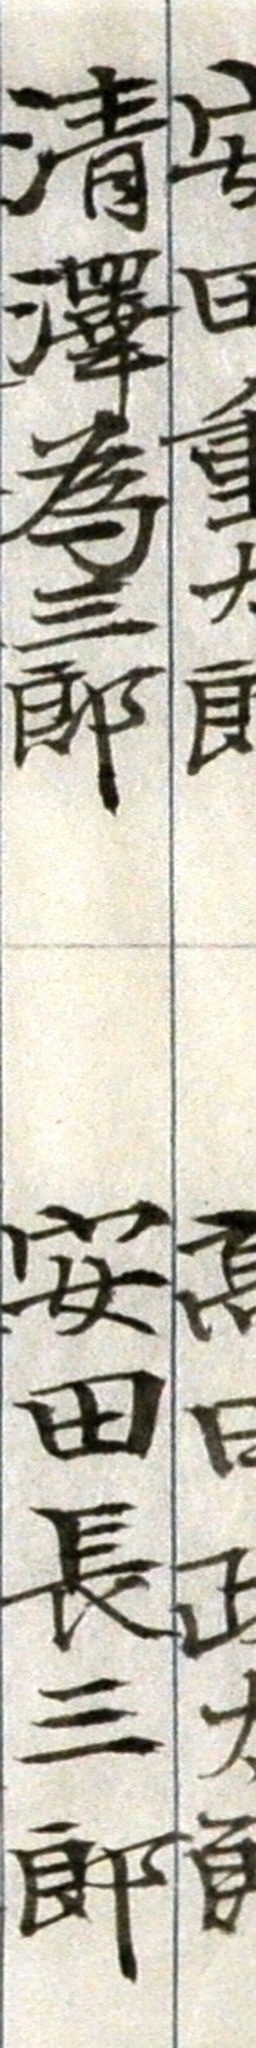清澤為三郎安田長三郎
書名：高遠藩兵員名簿歩兵銃隊・郷村募集員
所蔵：伊那市立高遠町図書館・合同会社AMANE
